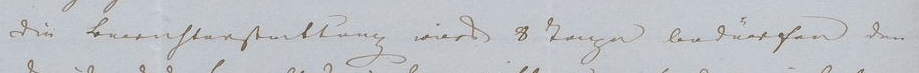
Die Berichterstattung wird 8 Tage bedürfen der
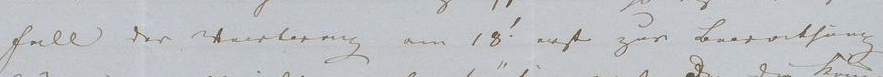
Fall der Vertrag am 18t erst zur Berathung
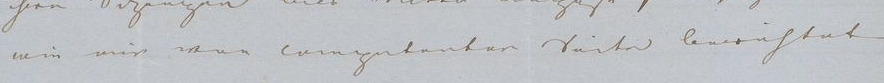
wie mir von competenter Seite berichtet
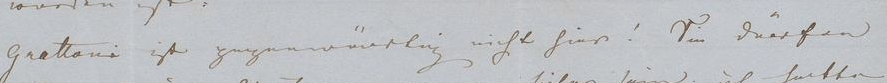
Grattoni ist gegenwärtig nicht hier! Sie dürfen
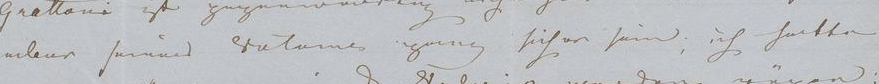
aber seines Votums ganz sicher sein; ich hatte
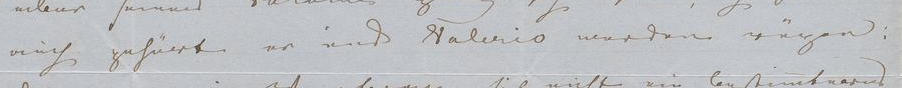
auch gehört er und Valerio werden rügen:
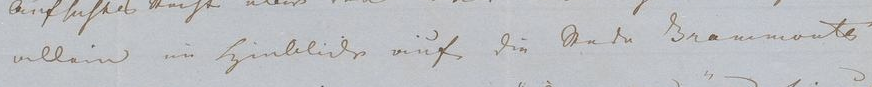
allein im Hinblik auf die Rede Grammonts
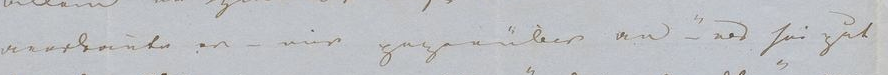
anerkannte er – mir gegenüber an – «es sei gut
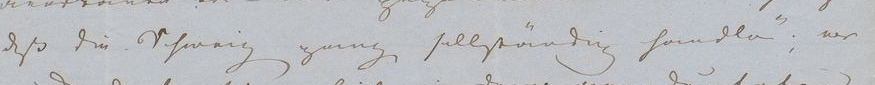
daß die Schweiz ganz selbständig handle»; er
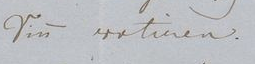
Sinn votiren.
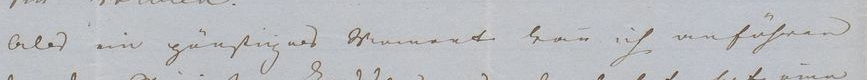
Als ein günstiges Moment kann ich anführen
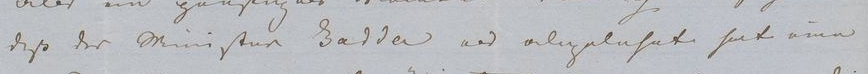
daß der Minister Gadda es abgelehnt hat eine
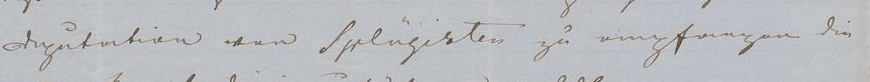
Deputation von Splügisten zu empfangen die
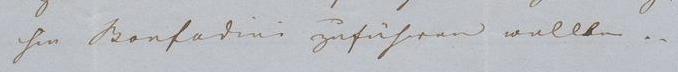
ihm Bonfadini zuführen wollte. –
